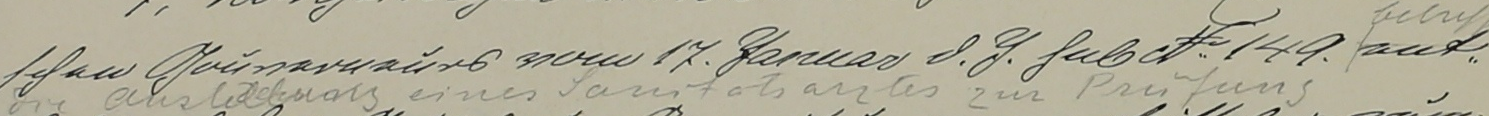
schen Gouverneurs vom 17. Januar d.J. sub No. 149. ent-
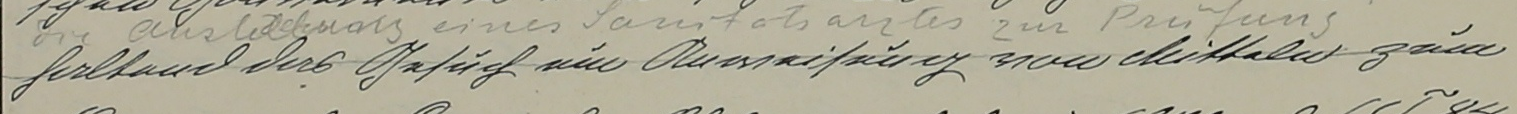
haltend das Gesuch um Anweisung von Mitteln zum
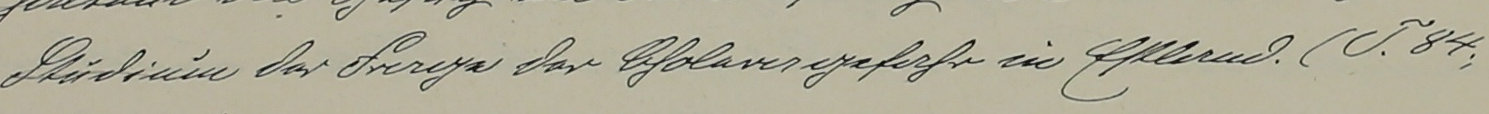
Studium der Frage der Choleragefahr in Estland. (T.84;
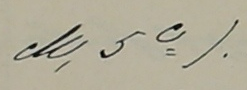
M.5c).
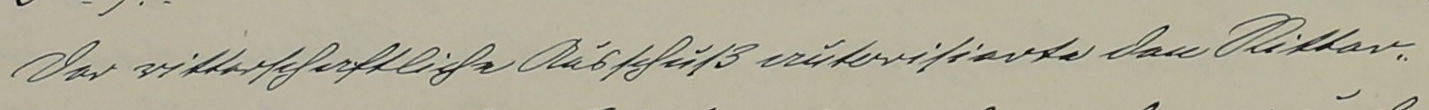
Der ritterschaftliche Ausschuß autorisierte den Ritter-
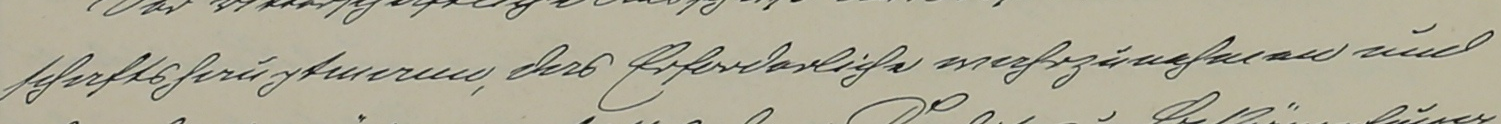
schaftshauptmann, das Erforderliche wahrzunehmen und
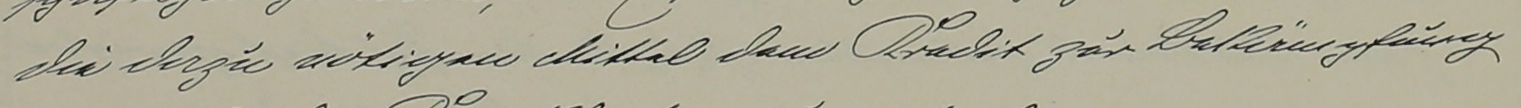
die dazu nötigen Mittel dem Kredit zur Bekämpfung
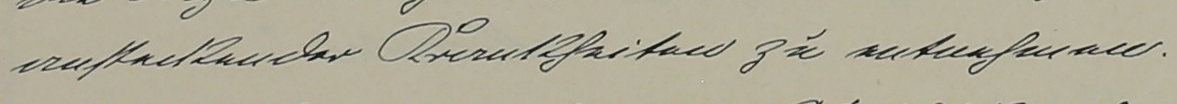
ansteckender Krankheiten zu entnehmen.
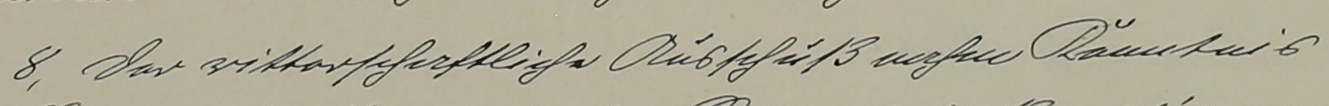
8. Der ritterschaftliche Ausschuß nahm Kenntnis
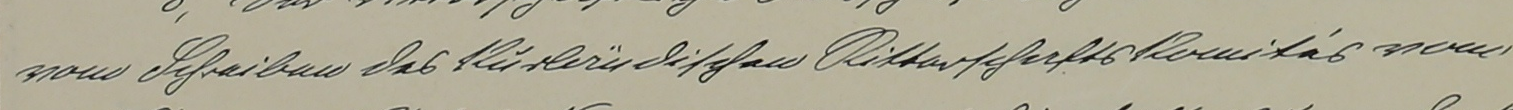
vom Schreiben des kurländischen Ritterschaftskomités vom
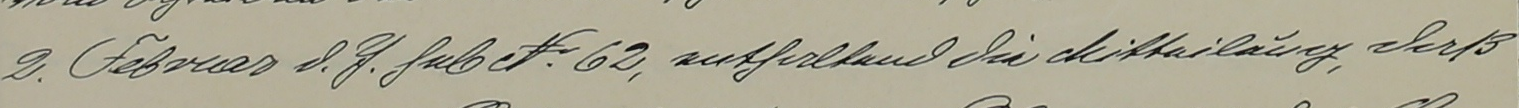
2. Februar d.J. sub No. 62, enthaltend die Mitteilung, daß
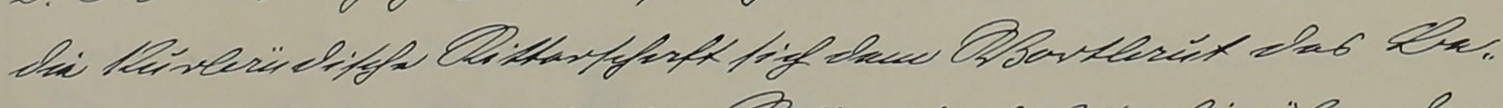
die kurländische Ritterschaft sich dem Wortlaut des Be-
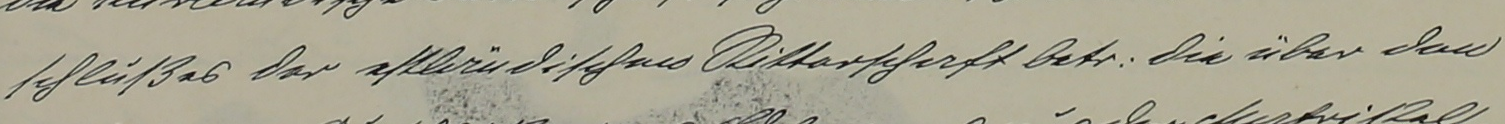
schlußes der estländischen Ritterschaft betr. die über den
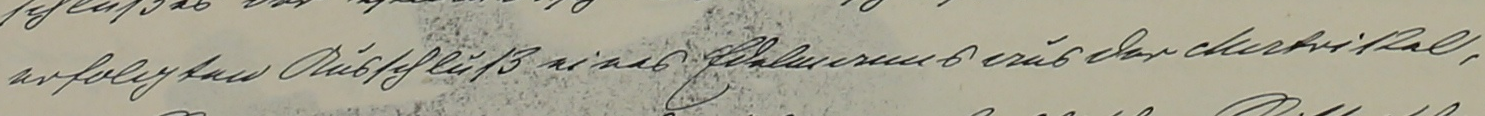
erfolgten Ausschluß eines Edelmanns aus der Matrikel,
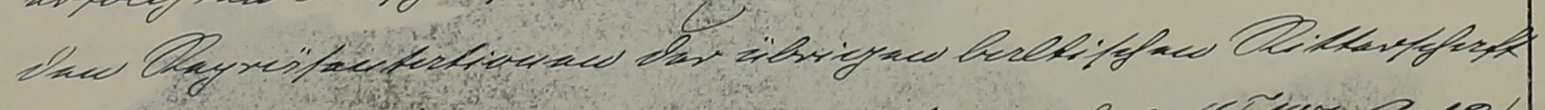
den Repräsentationen der übrigen baltischen Ritterschaft
